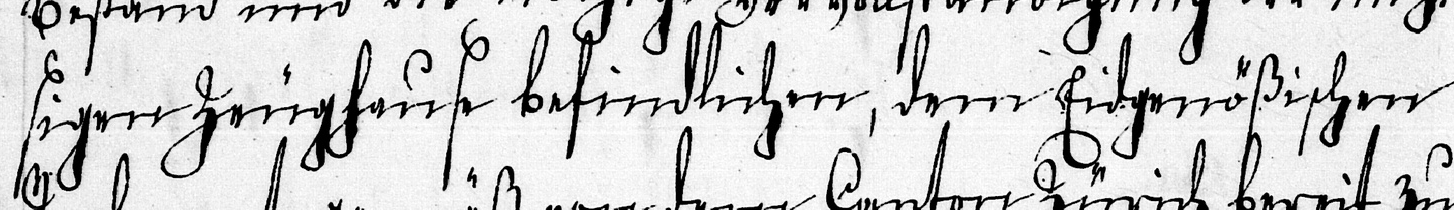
sigen Zeughause befindlichen, dem Eidgenößischen
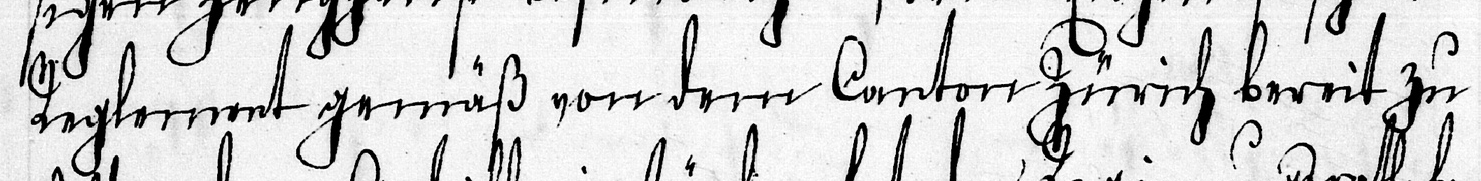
Reglement gemäß von dem Canton Zürich bereit zu
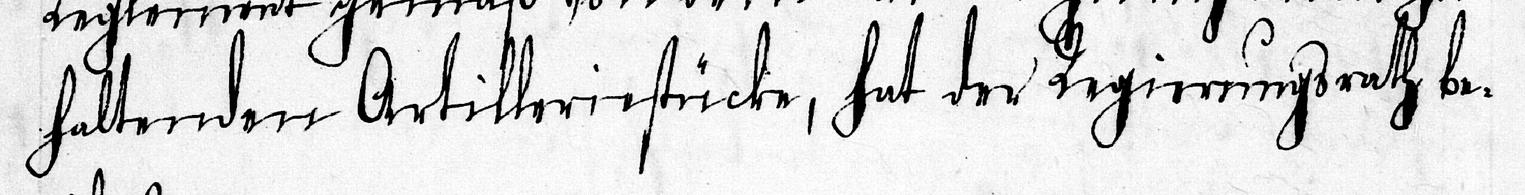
haltenden Artilleriestücke, hat der Regierungsrath be¬
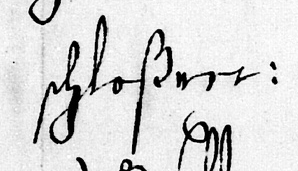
schloßen:
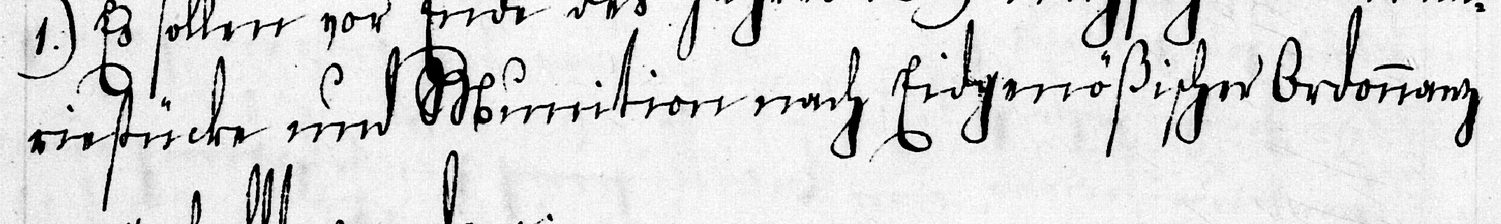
eriestücke und Munition nach Eidgenößischer Ordonnanz
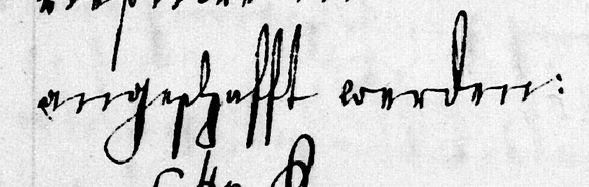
angeschafft werden:
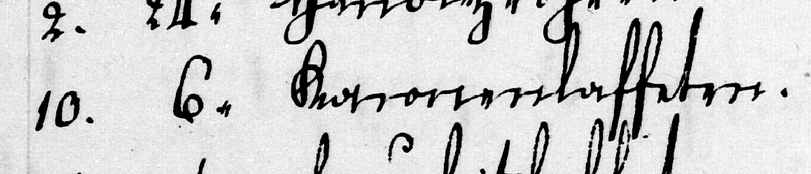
10. 6 “ Kanonenlaffeten.
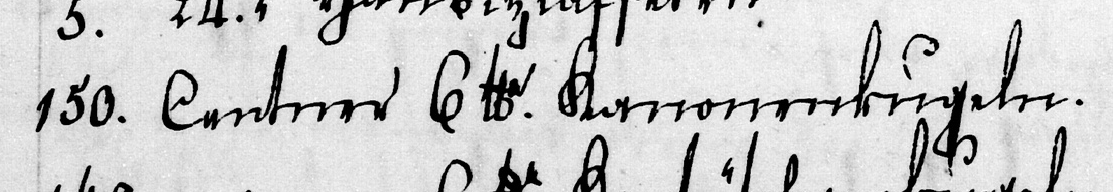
150. Centner 6 lbr. Kanonenkugeln.
